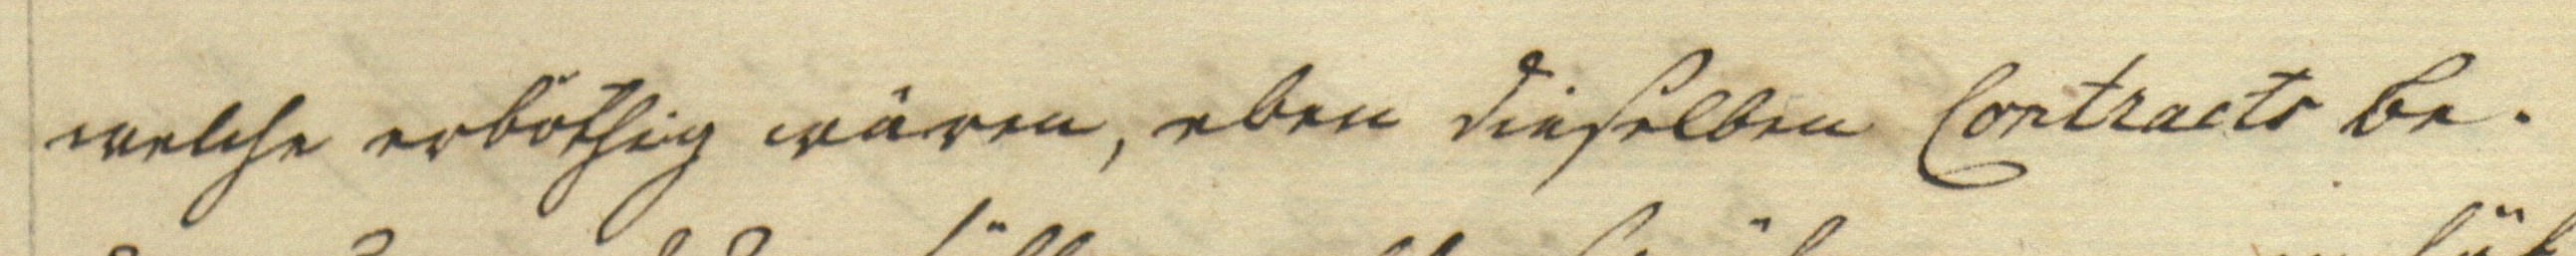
welche erböthig wären, eben dieselben Contracts be¬
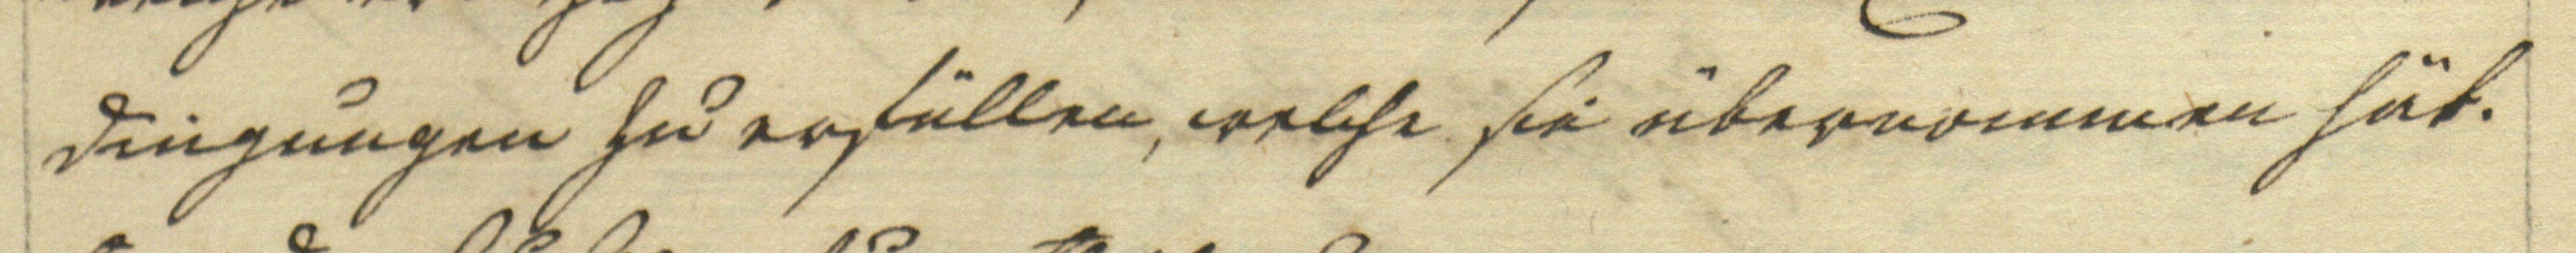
dingungen zu erfüllen, welche sie übernommen hät¬
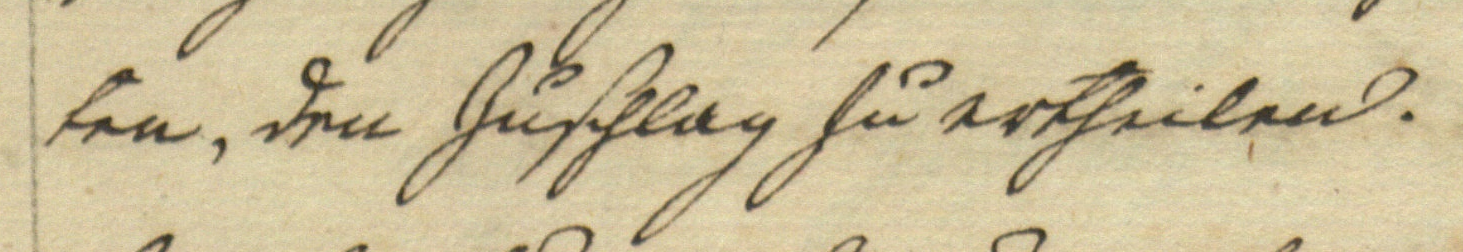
ten, den Zuschlag zu ertheilen.
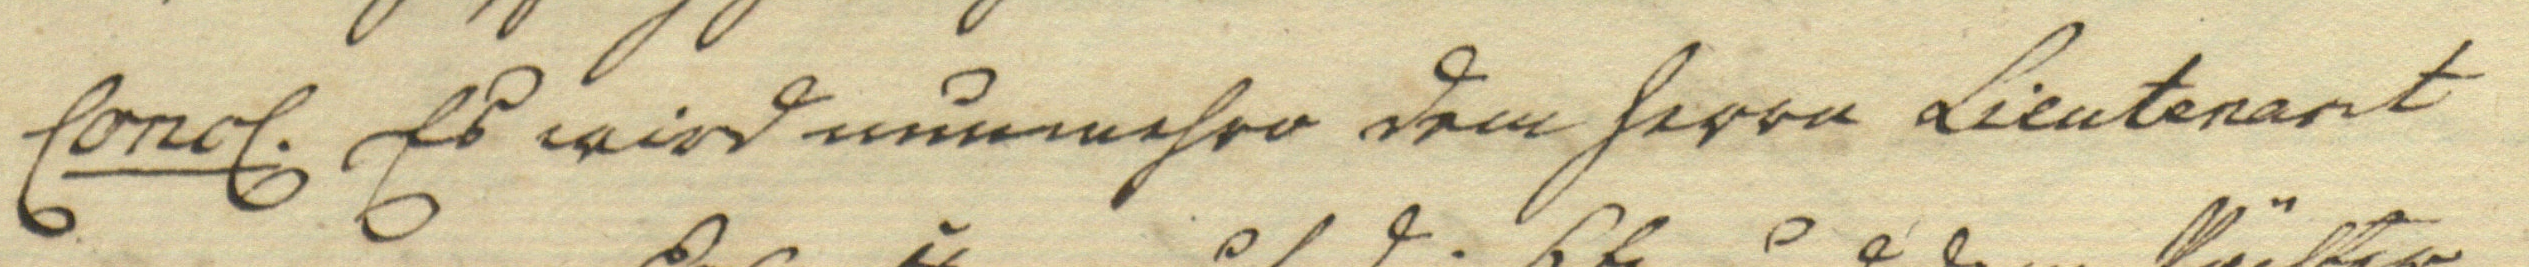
Concl., Es wird nunmehro dem Herrn Lieutenant
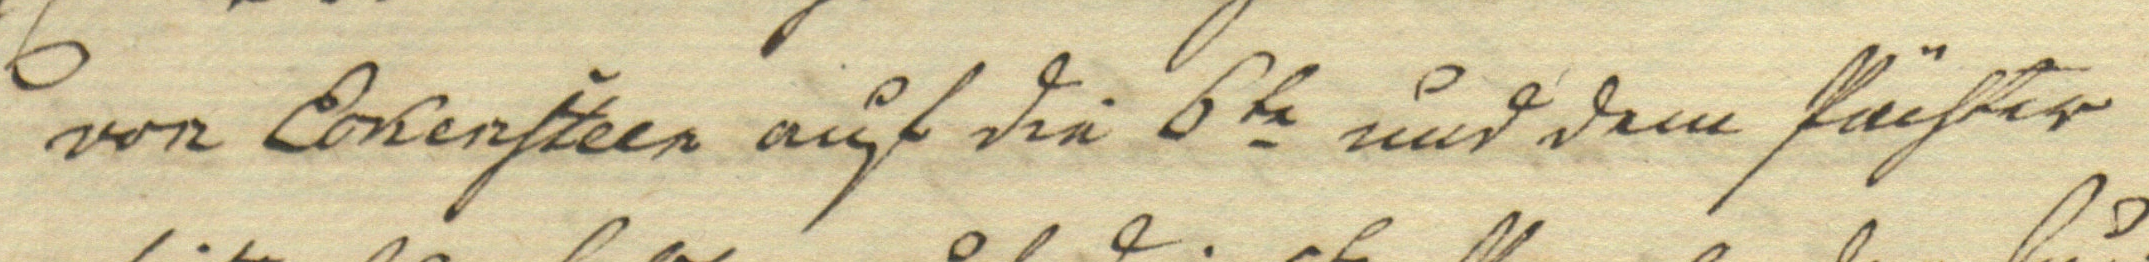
von Eckensteen auf die 6 te und dem Pächter
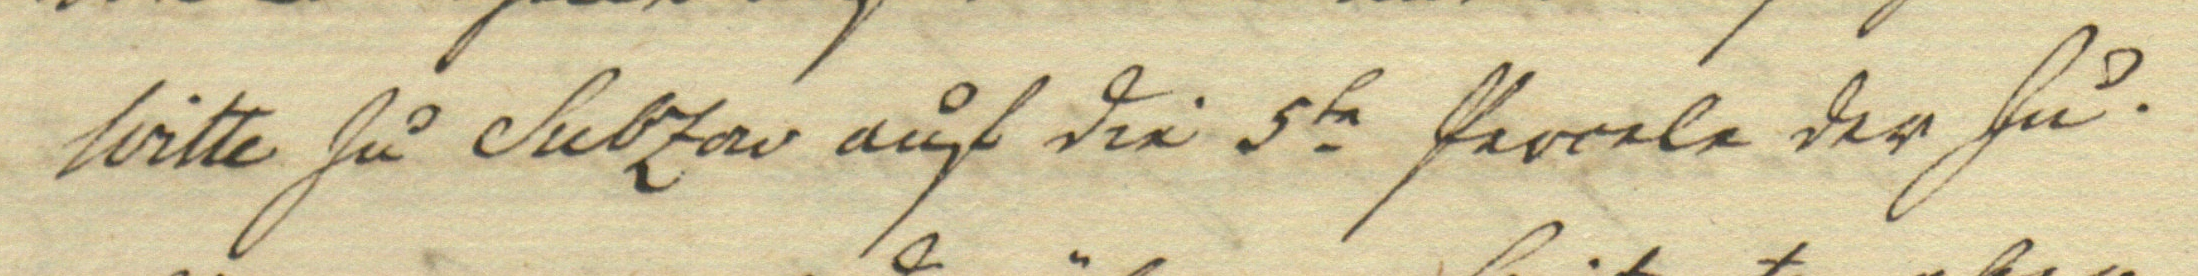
Witte zu Subzow auf die 5 te Percele der Zu¬
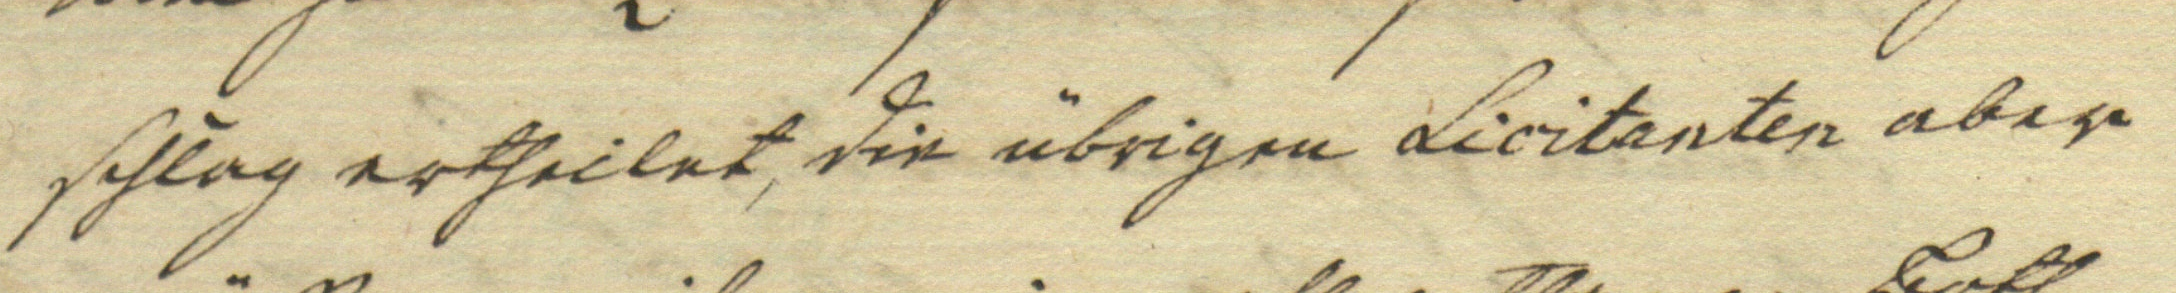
schlag ertheilet. Die übrigen Licitanten aber
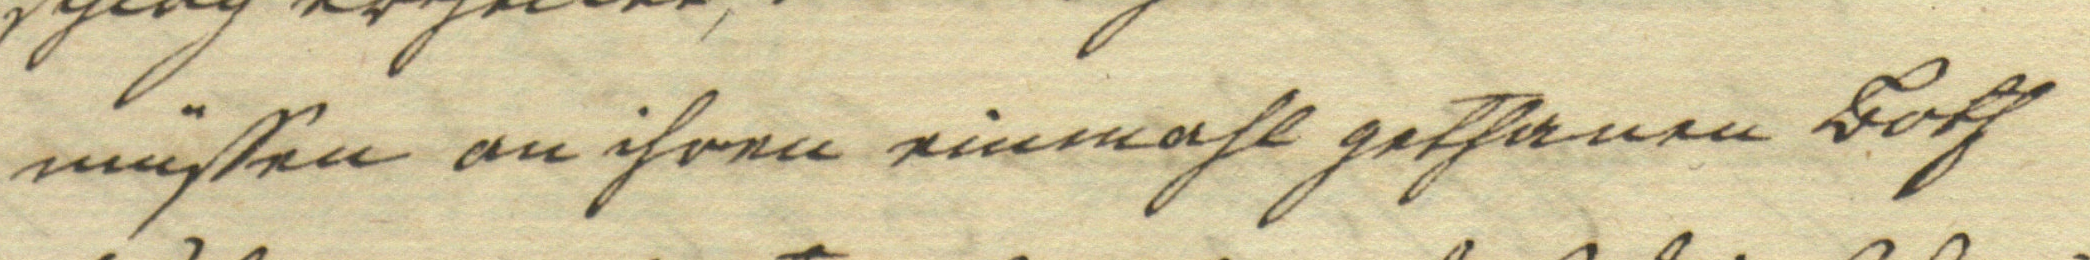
müssen an ihren einmahl gethanen Both
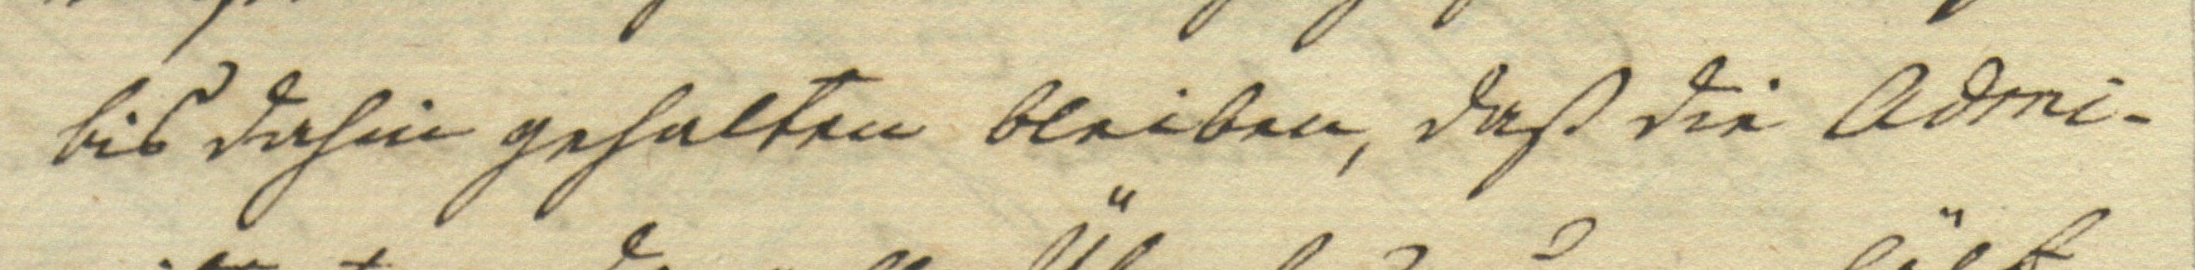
bis dahin gehalten bleiben, daß die Admi¬
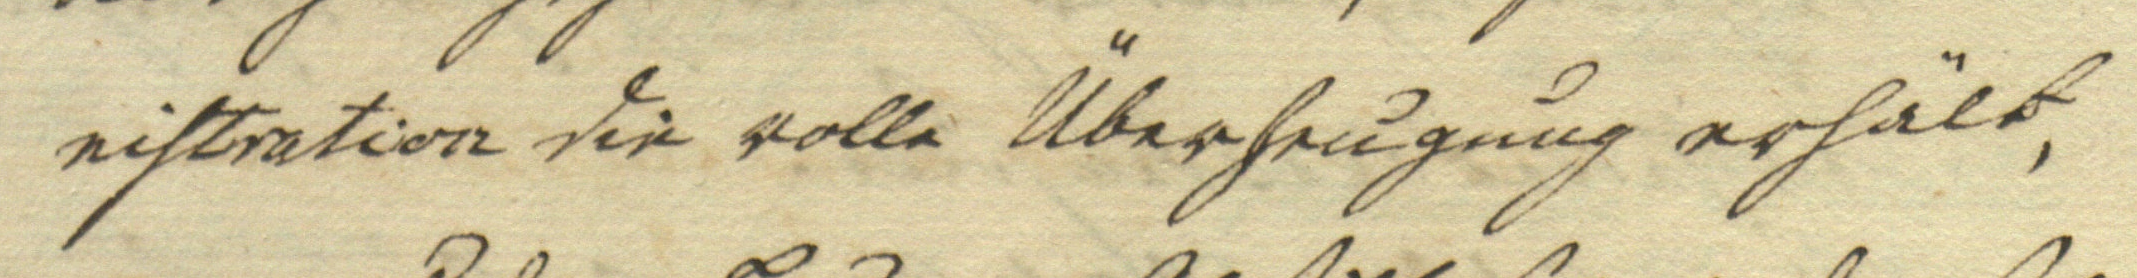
nistration die volle Überzeugung erhält,
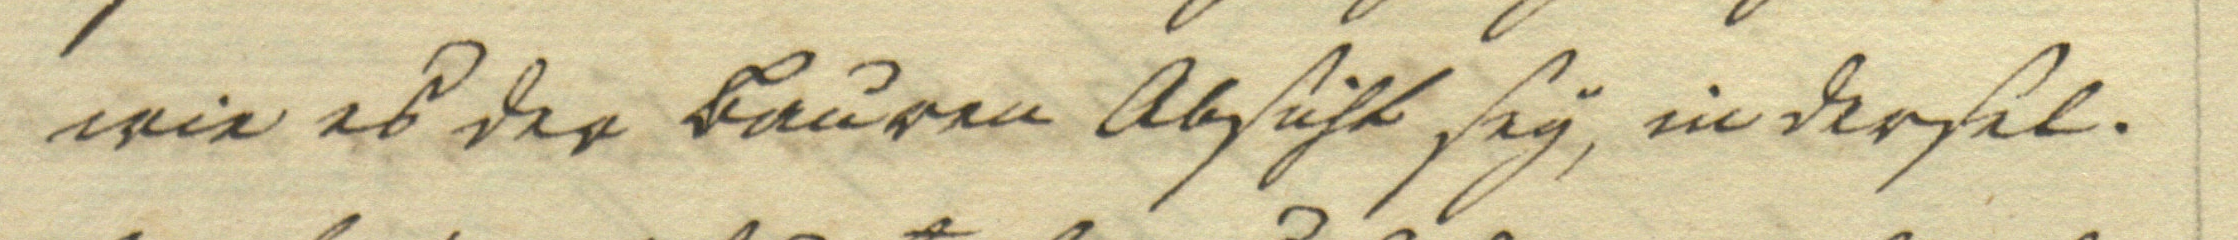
wie es der Bauren Absicht seÿ, in dersel¬
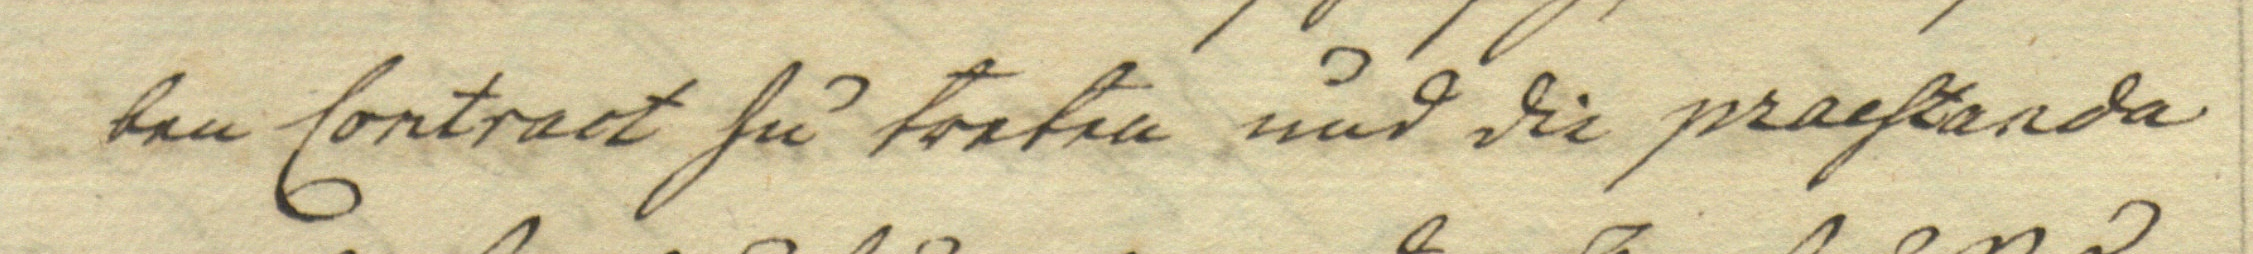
ben Contract zu treten und die praestanda
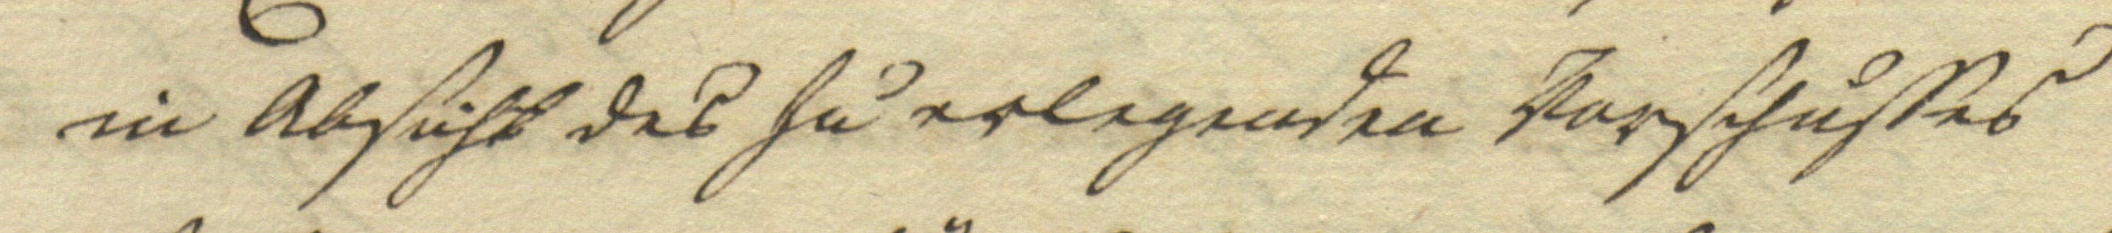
in Absicht des zu erlegenden Vorschusses
